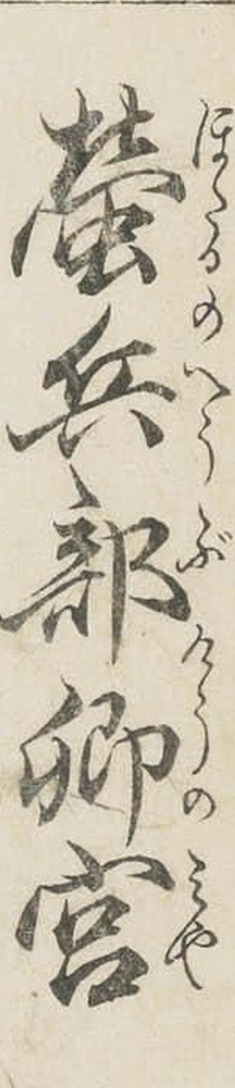蛍兵部卿宮
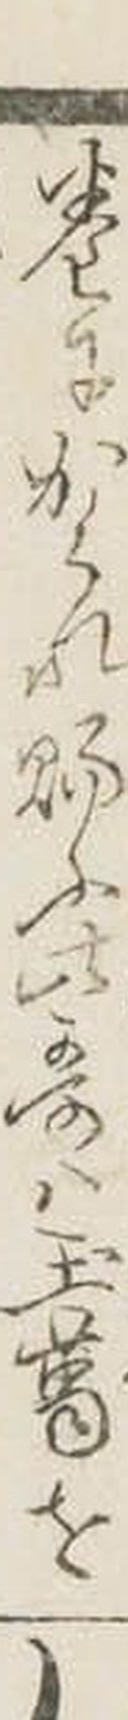巻にかくれ賜ふ此哥は玉葛を
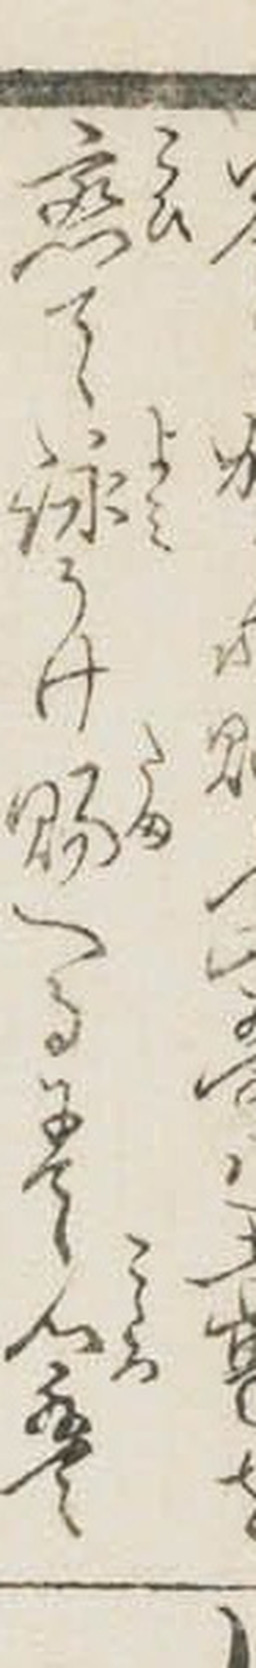恋て詠かけ賜へるにて心は
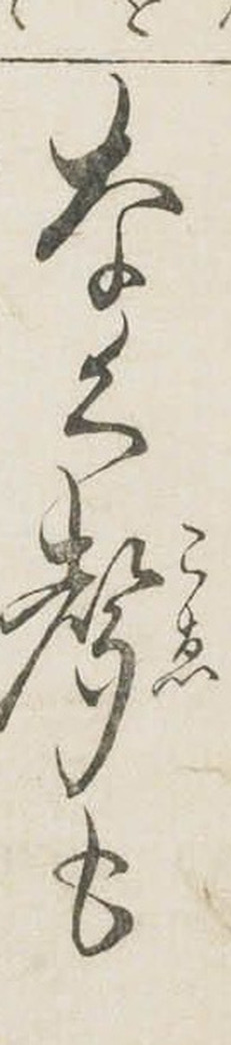なく声も
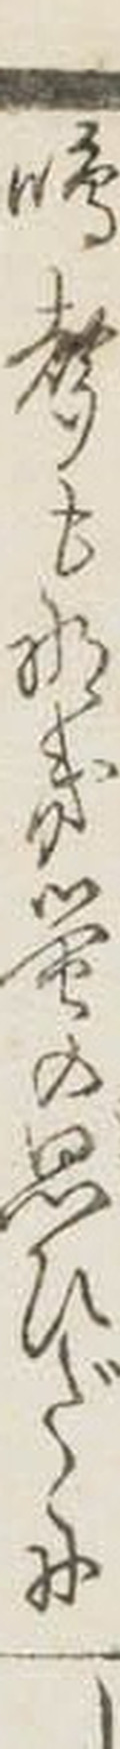鳴声もなき蛍の思ひだに
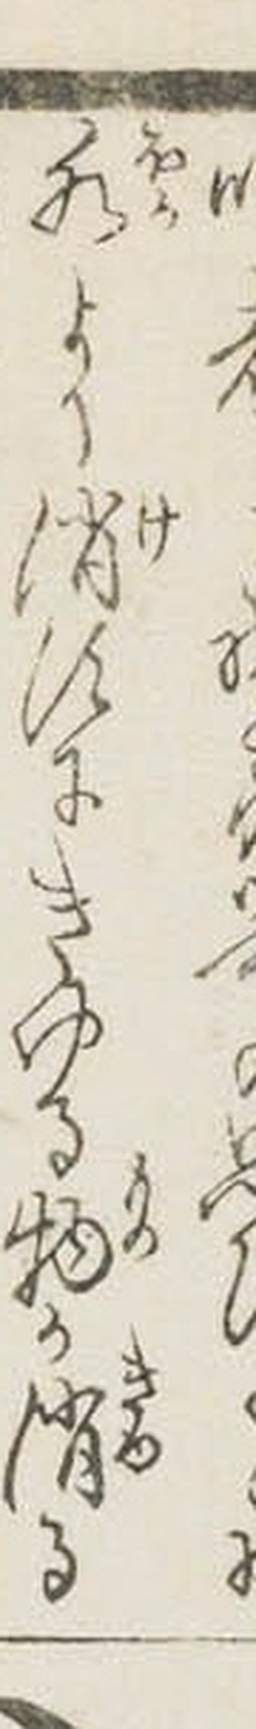外より消すにきゆる物か消る
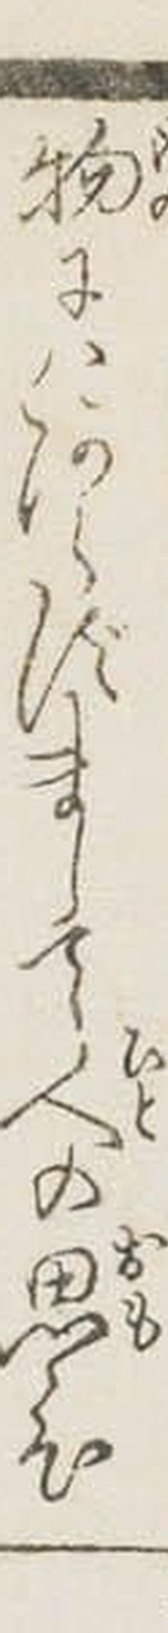物にはあらずまして人の思ひ
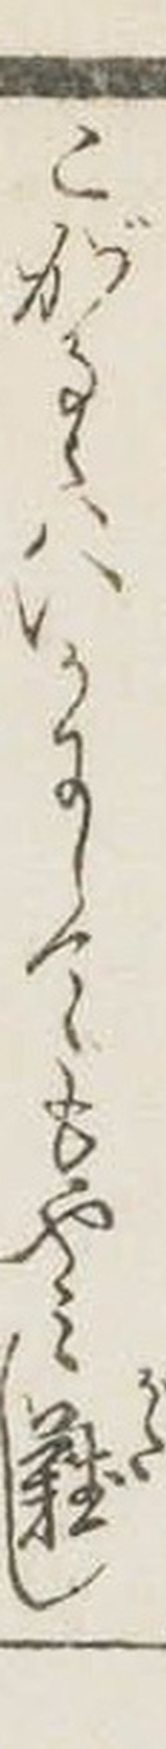こがるゝはいかにしてもやみ難し
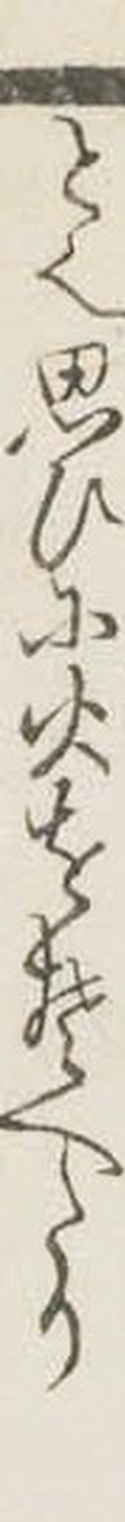と也思ひに火をそへたり
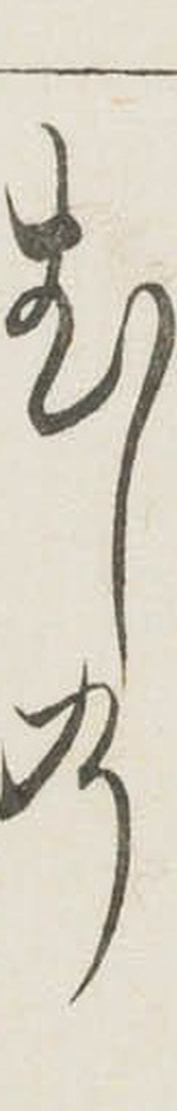むしの
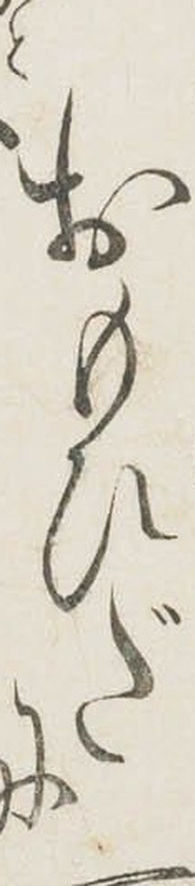おもひだに
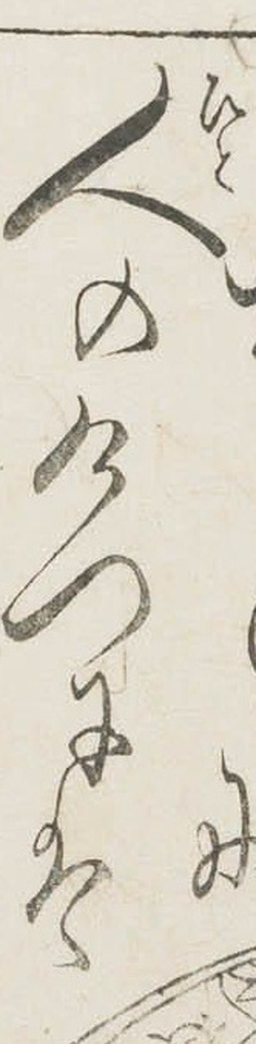人のけつには
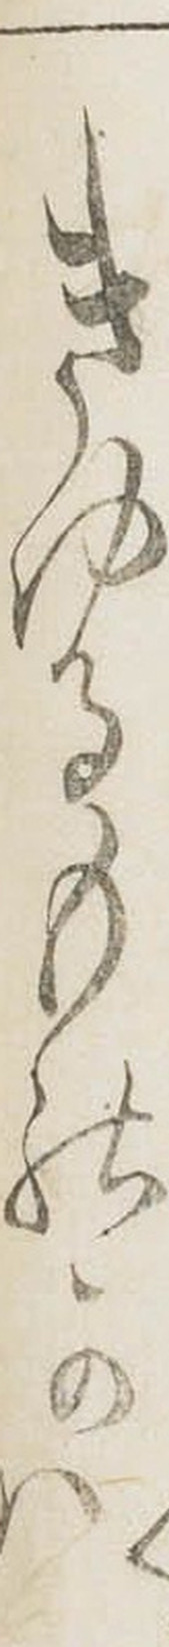きゆるものかは
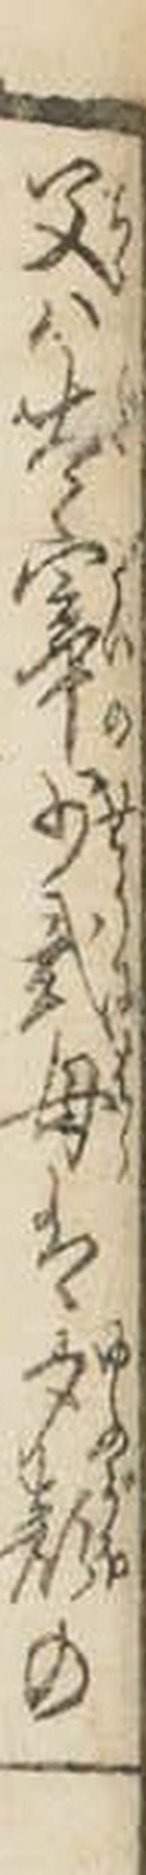父は太宰少弐母は夕顔の
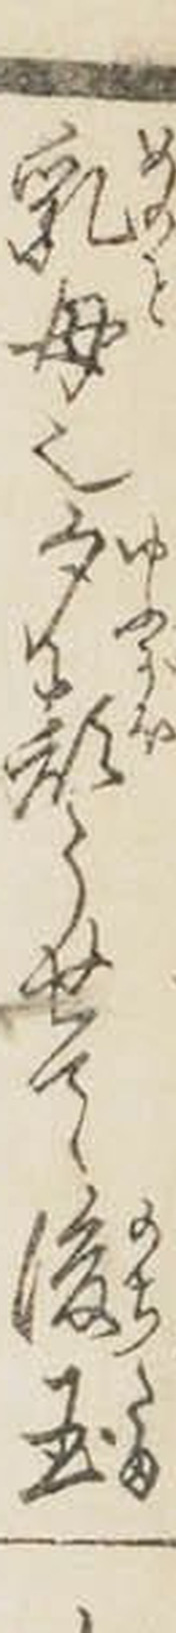乳母也夕顔うせて後玉
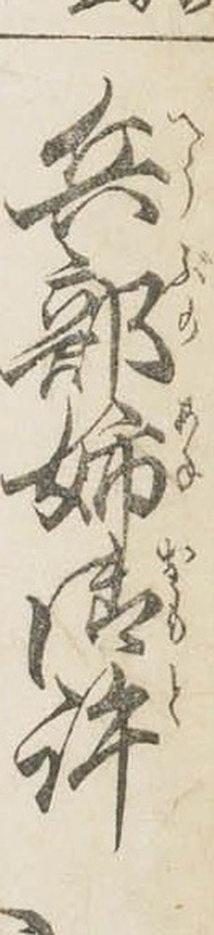兵部姉御許
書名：源氏百人一首
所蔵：東京学芸大学教育コンテンツアーカイブ
